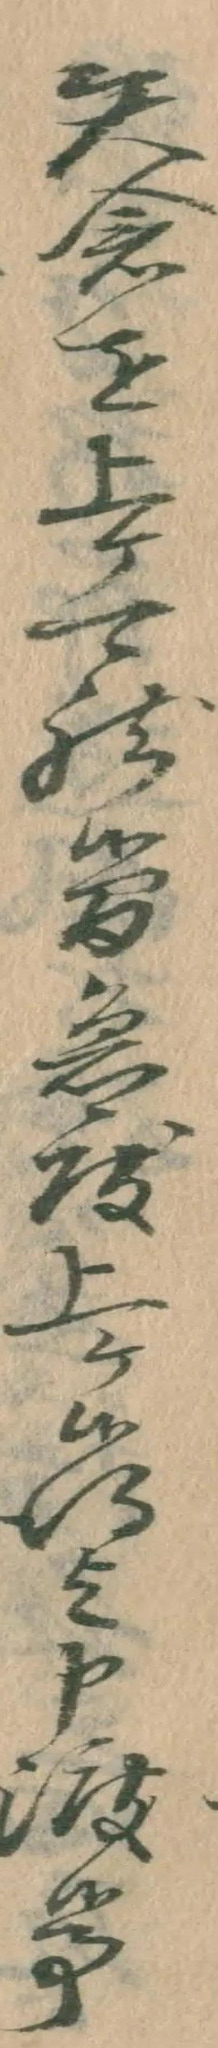矢倉を上ヶ可然候間急度上ヶ候得と申渡候事
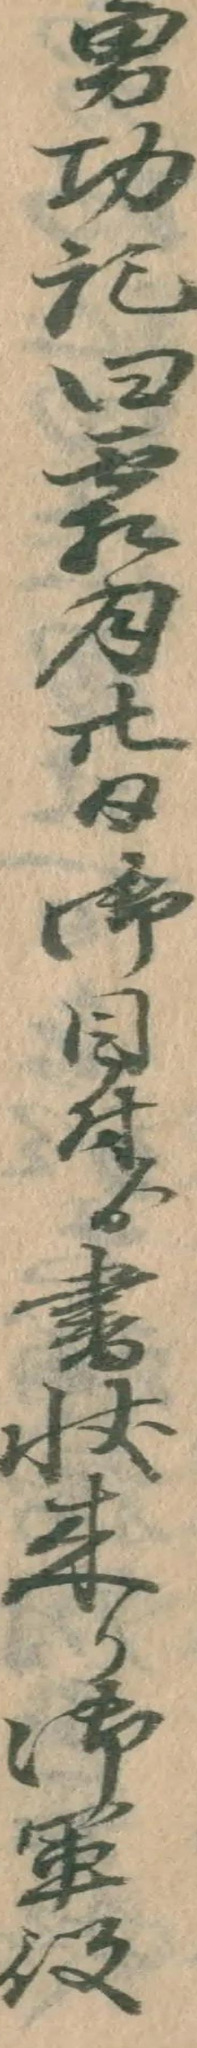勇功記曰霜月廿日御目付ゟ書状来り御軍役
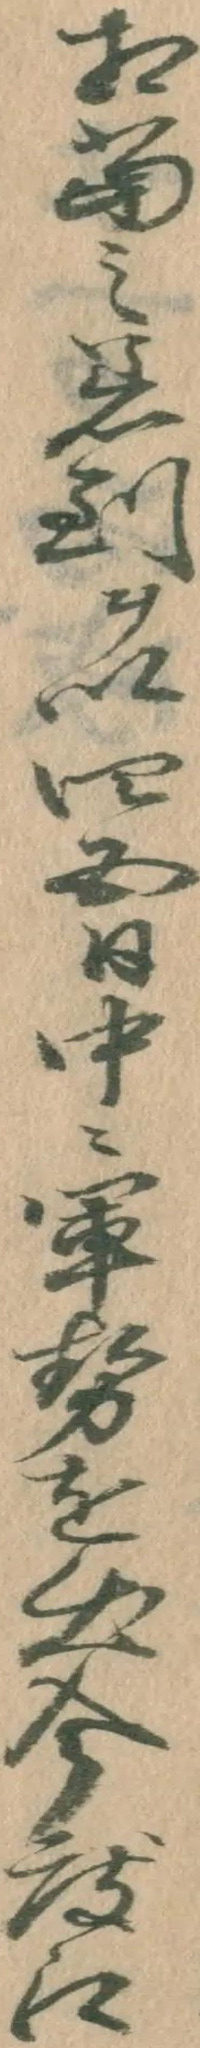相当之着到ヲ以四五日中に軍勢を出今度江
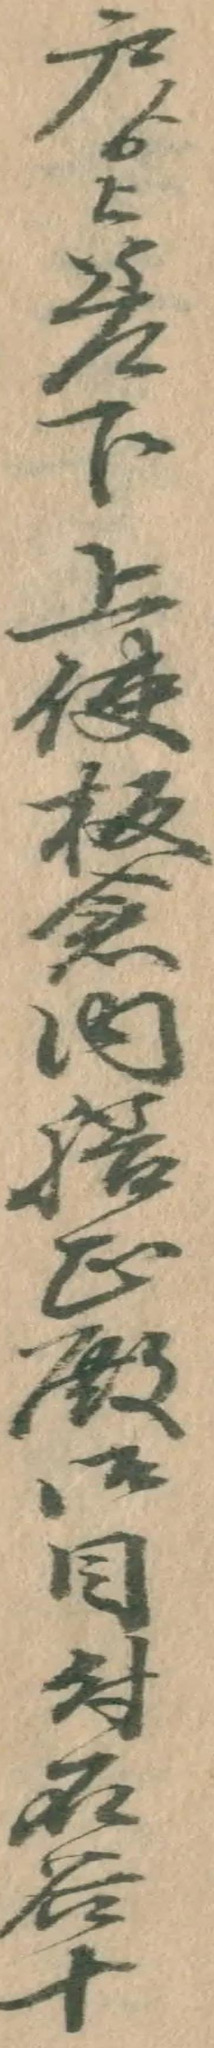戸ゟ被差下上使板倉内膳正殿御目付石谷十
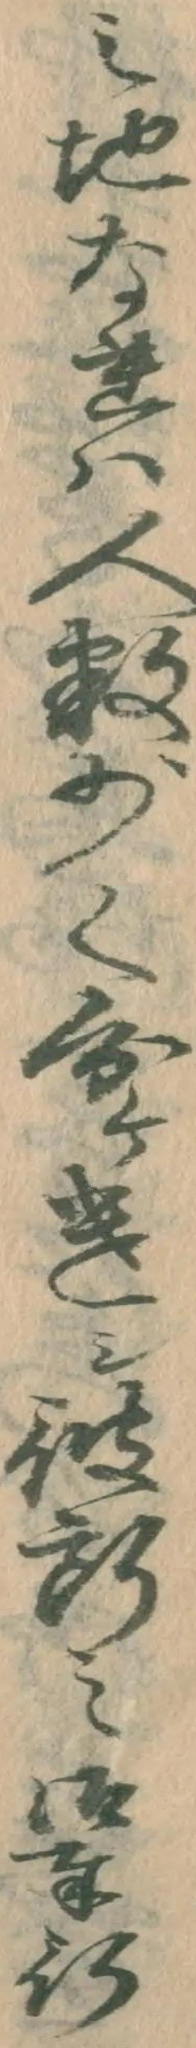之地なれは人数少く分ヶ遣シ彼所之御奉行

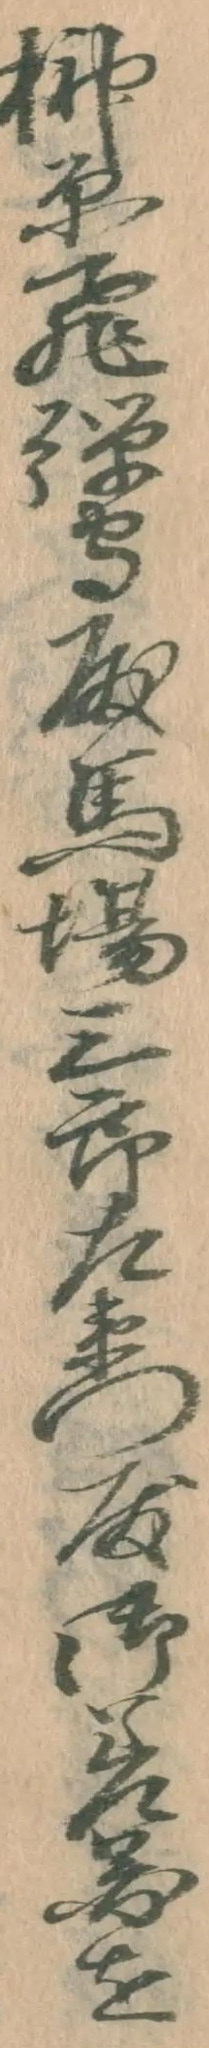榊原飛騨守殿馬場三郎左衛門殿御差図を
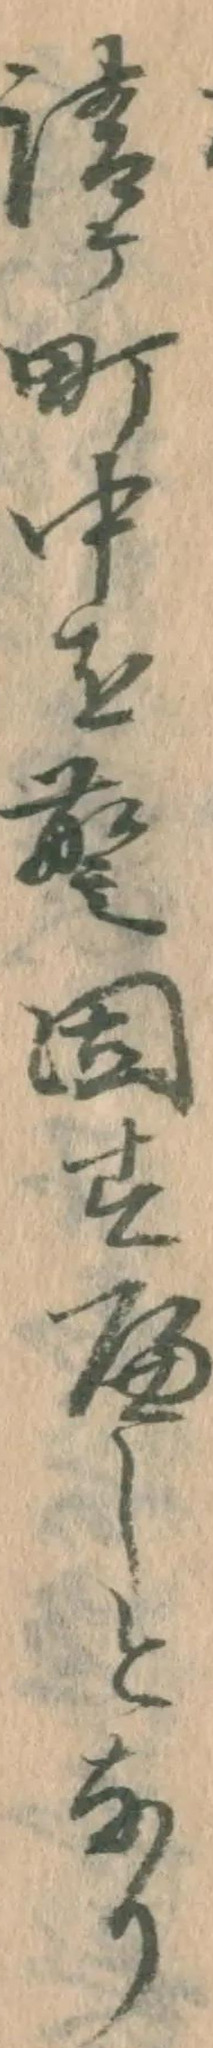請ケ町中を警固すへしつなり
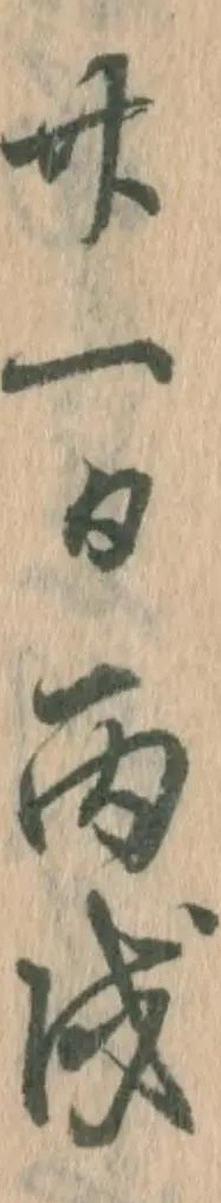廿一日丙戌
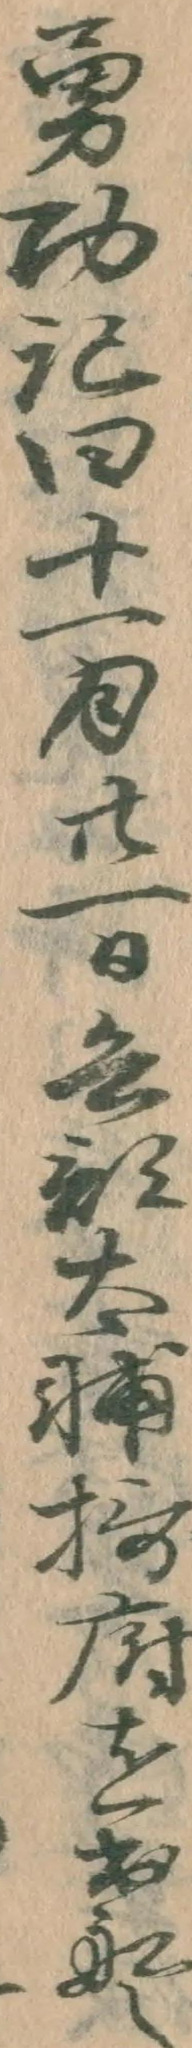勇功記曰十一月廿一日色部太輔摂府を出船し
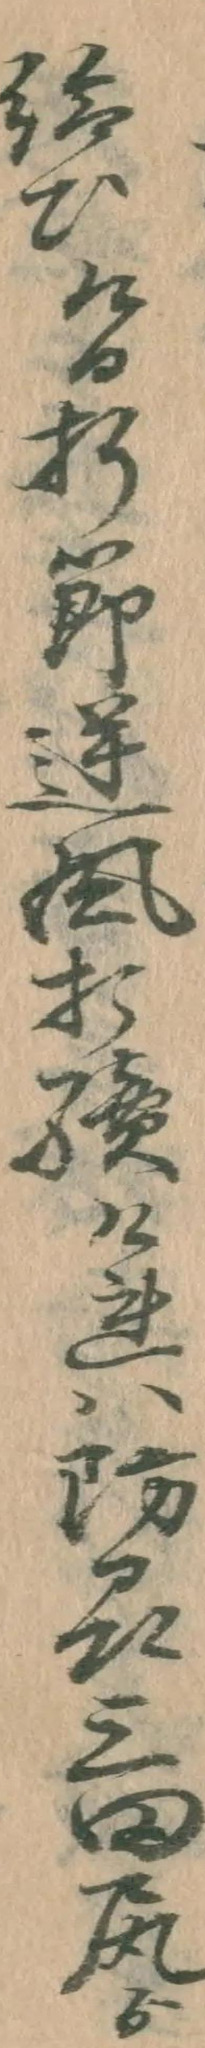給ひける折節逆風打続けれは防州三田尻ゟ
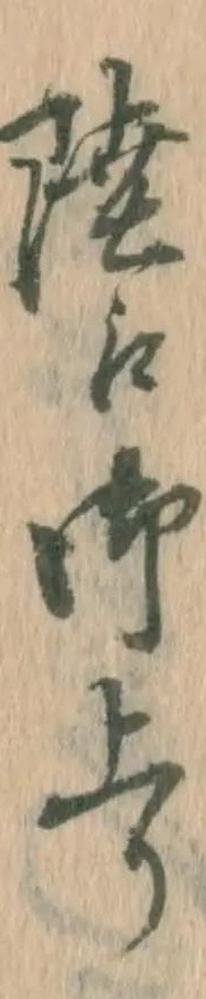陸江御上り
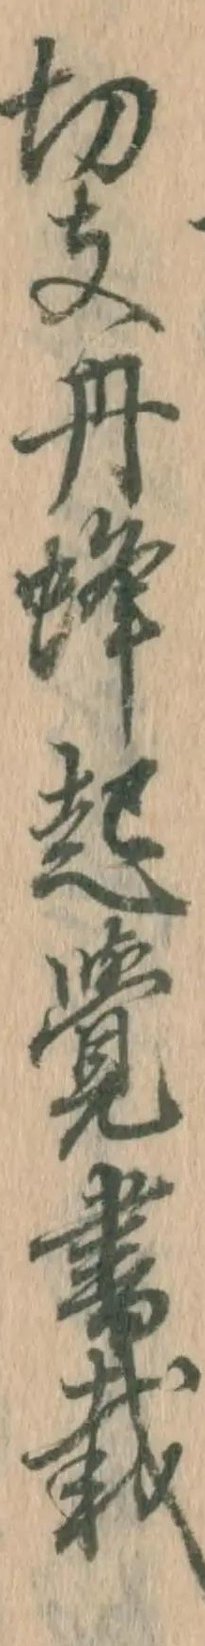切支丹蜂起覚書載
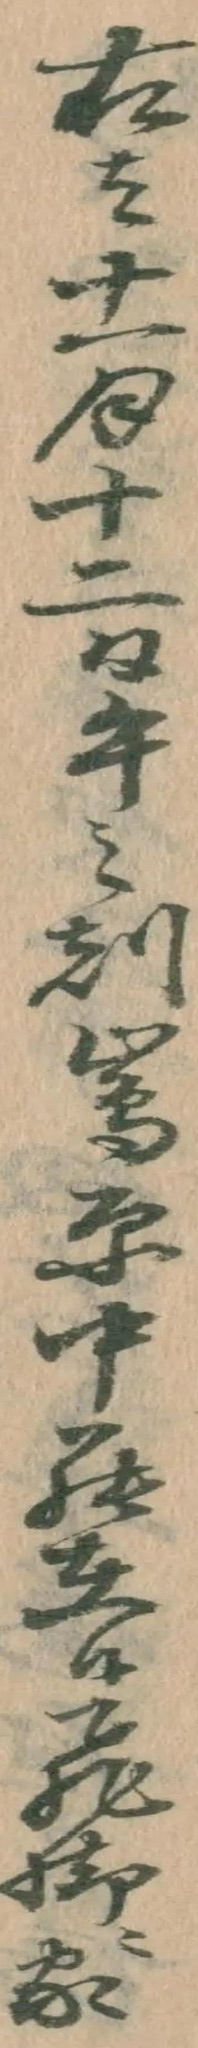右は十一月十二日午之刻島原中罷在候飛脚に家
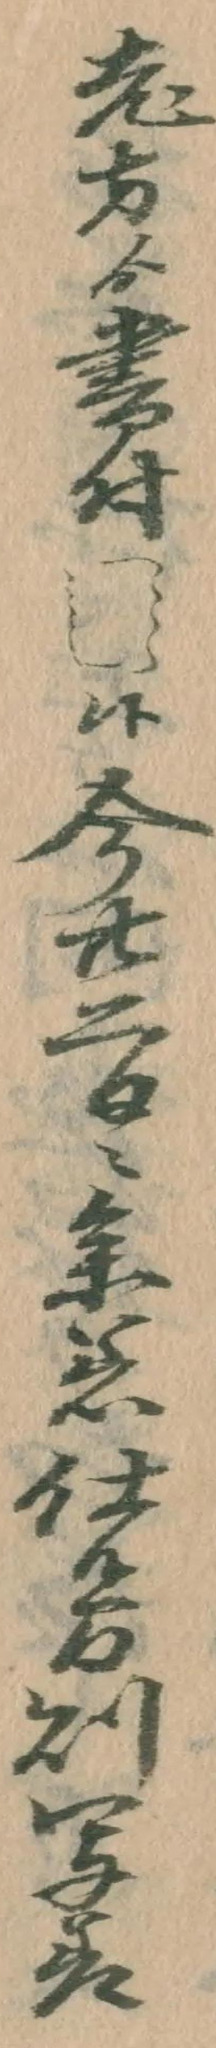老方ゟ書付候今廿二日に参着仕候間則写差
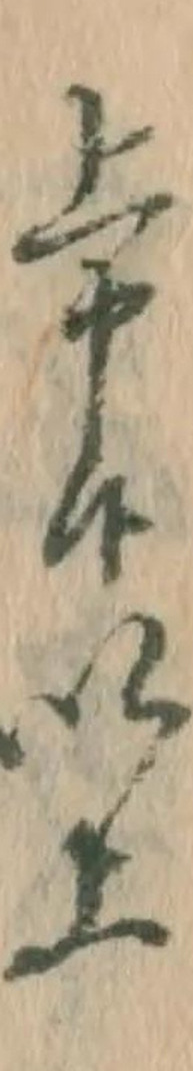上申候以上
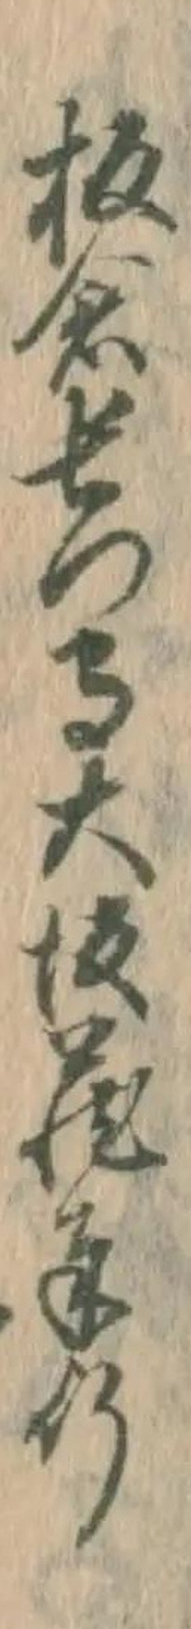板倉長門守大坂蔵奉行
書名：切支丹御退治記 49巻. [3]
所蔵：国立国会図書館 National Diet Library, JAPAN
